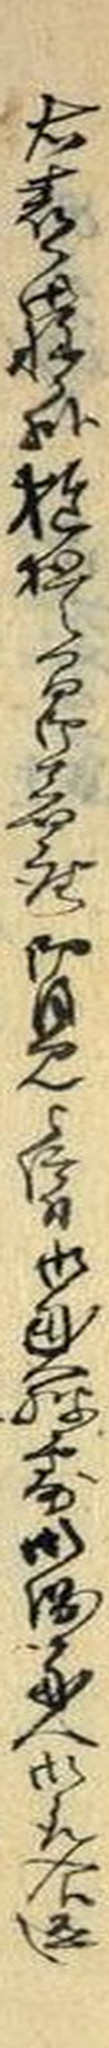右表へ御移掛韃靼之間御着座御目見被仰付御用人披露御側御用人御取合有之
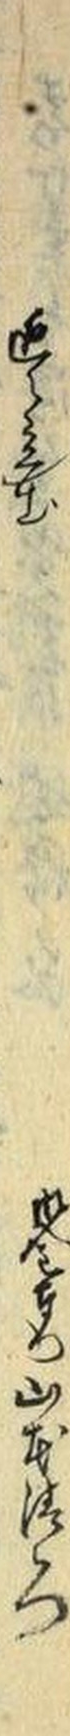追々立出御金奉行山本清右衛門
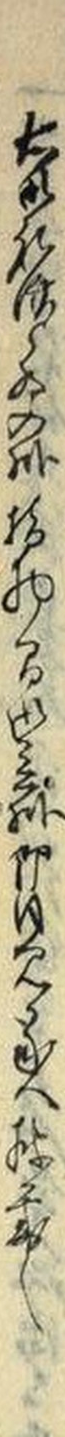右御礼済被為入掛指物之間御立掛御目見御用人披露之
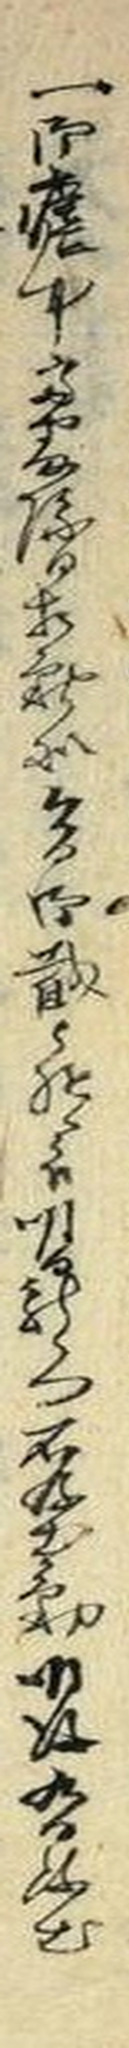一御瘧中当番隔日相勤候処今日御截被遊候ニ付明日新右衛門不及出勤明後九日致出
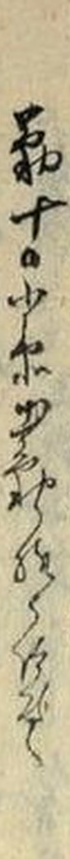勤十日小兵衛出勤候様被仰出候
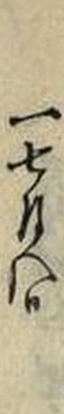一七月八日
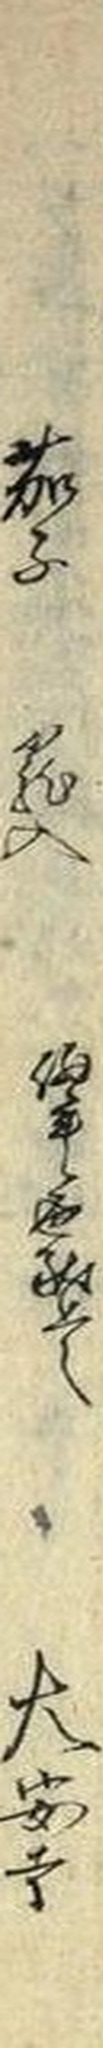茄子籠入例年之通献上之大安寺
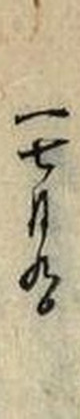一七月九日
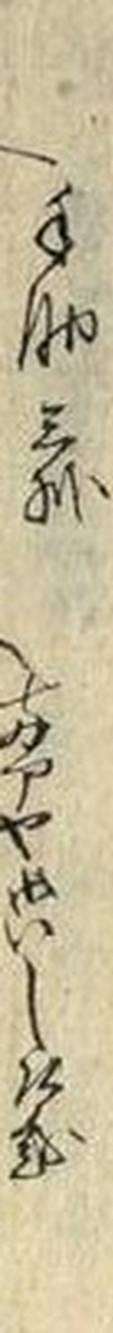名酒弐樽両部や御いし頂戴
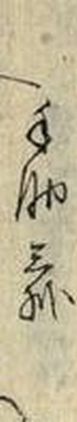手助三掛
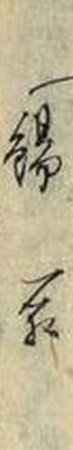鯣一箱
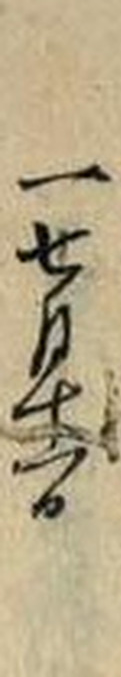一七月十一日

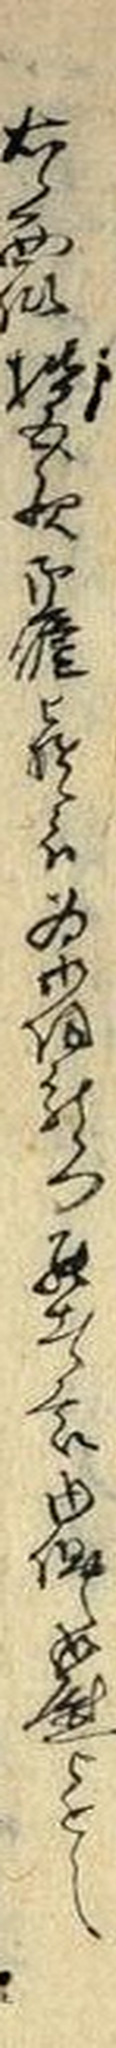右之西瓜揩五郎様御瘧被遊候ニ付為御伺新右衛門罷出候節御側之御慰被進之
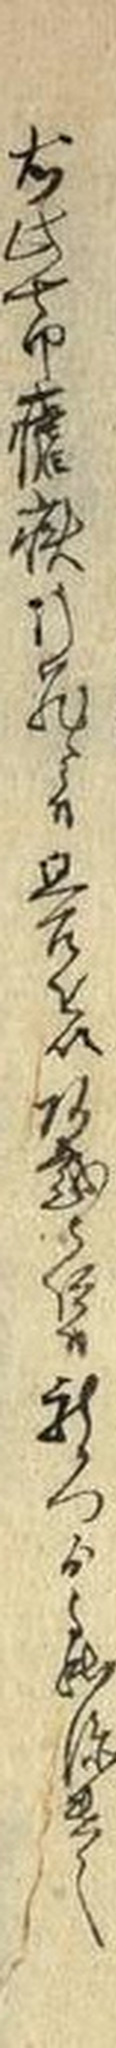右此節瘧疾引籠候付思召を以頂戴被仰付新右衛門ゟ手紙添遣之
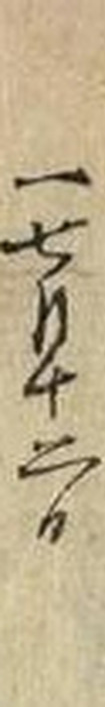一七月十二日
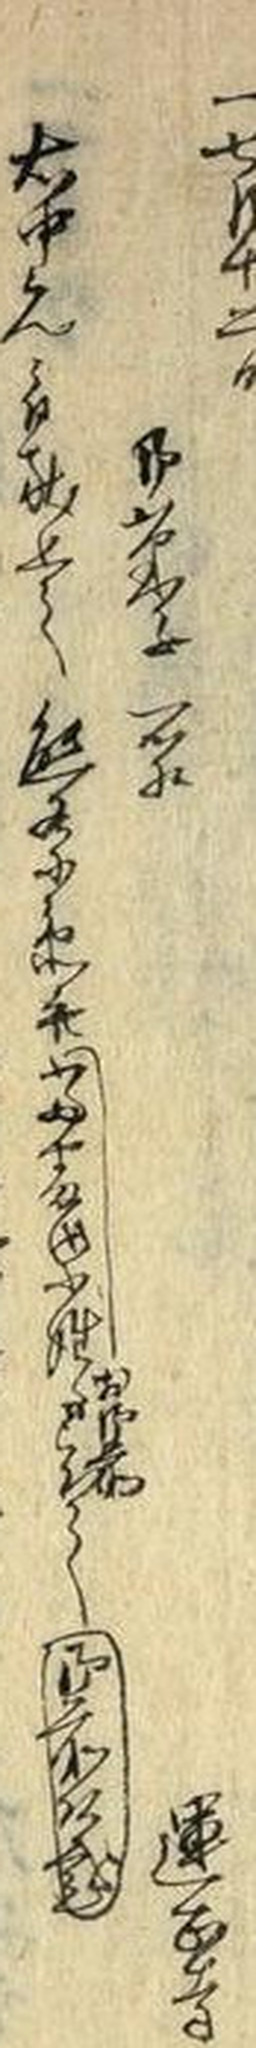右中元ニ付献上之熊谷小兵衛并於御前当番御小姓へ被下之御前頂戴
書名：少傅日録抄（斉承付側向頭取日記、在国）
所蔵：福井県文書館 Fukui Prefectural Archives
